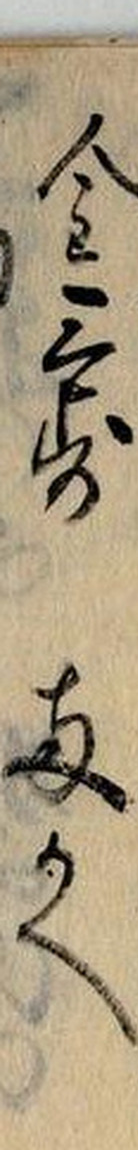金三歩両かへ
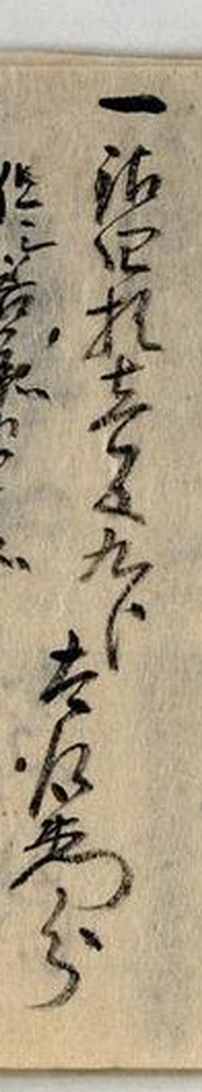一銀四十一匁九分太左衛門分
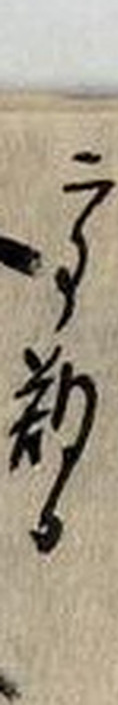二月朔日
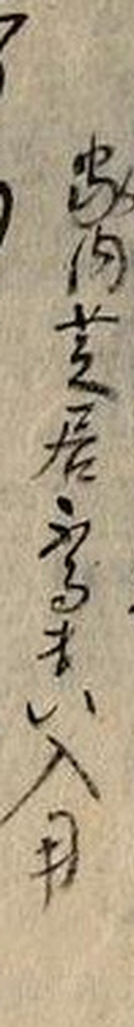家内芝居ふるまい入用
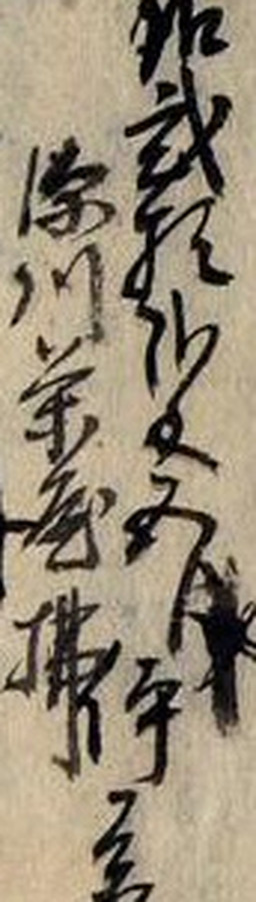深川茶屋払
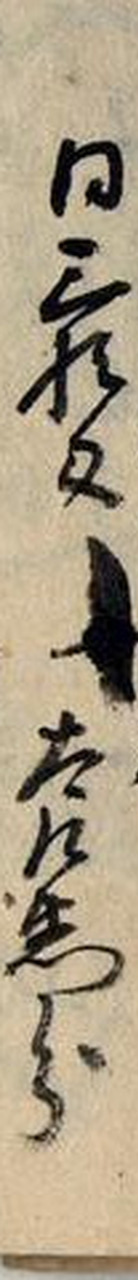同三拾匁太左衛門分

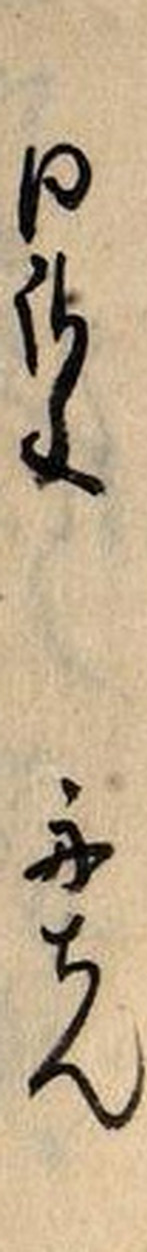同弐匁舟ちん
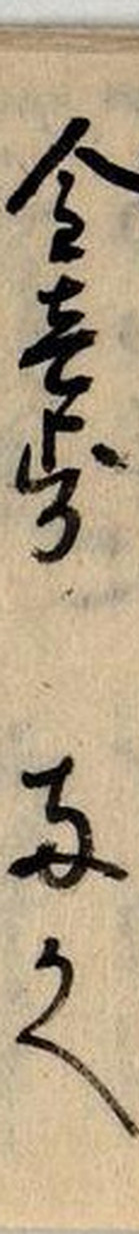金壱歩両かへ
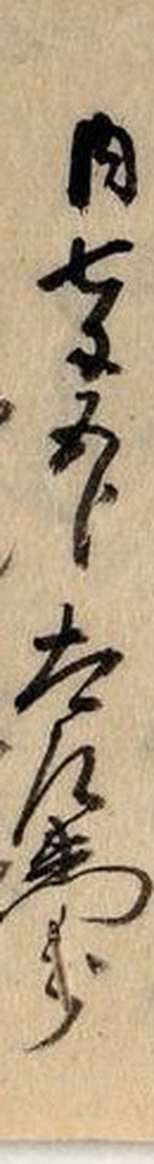内七匁五分太左衛門分
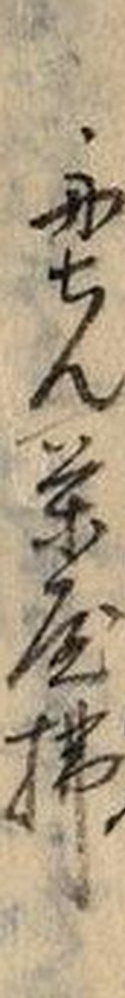舟ちん茶屋払
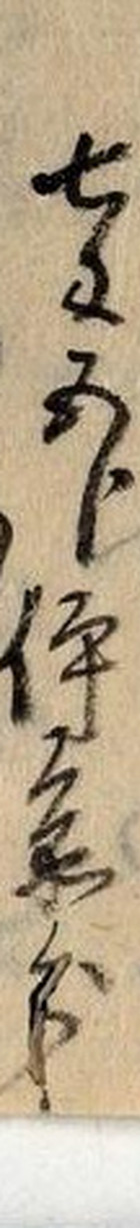七匁五分伊兵衛分
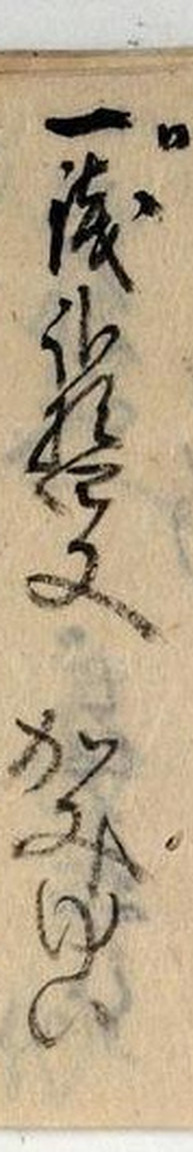一銭弐拾四文かみゆい
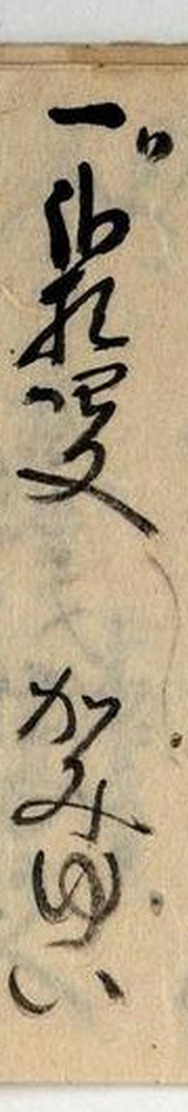一弐拾四文かみゆい
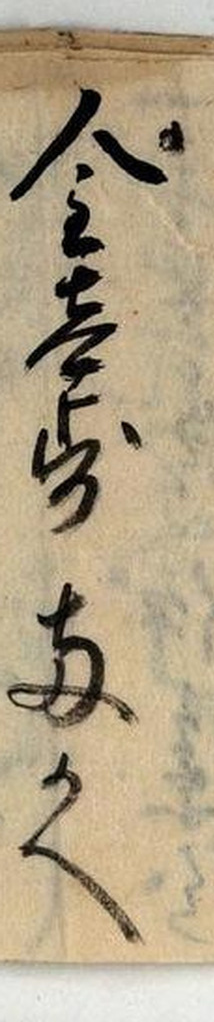金壱歩両かへ
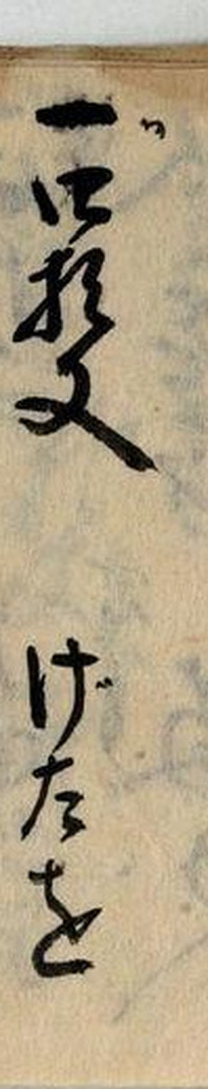一四拾文げたを
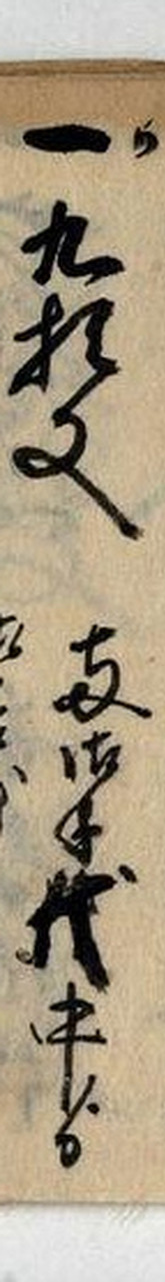一九拾文両御手代中ゟ
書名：道中小遣留帳（旅）
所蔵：福井県文書館 Fukui Prefectural Archives
